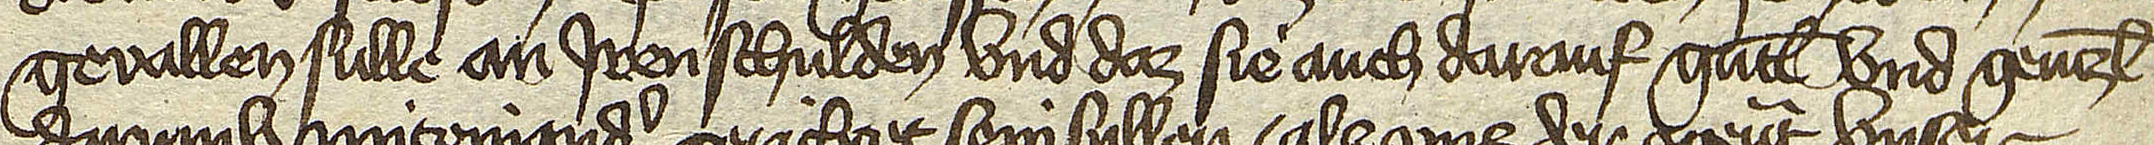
gevallen ſulle an Iren ſchulden vnd daʒ ſie auch darauf gutl* vnd gencʒl*
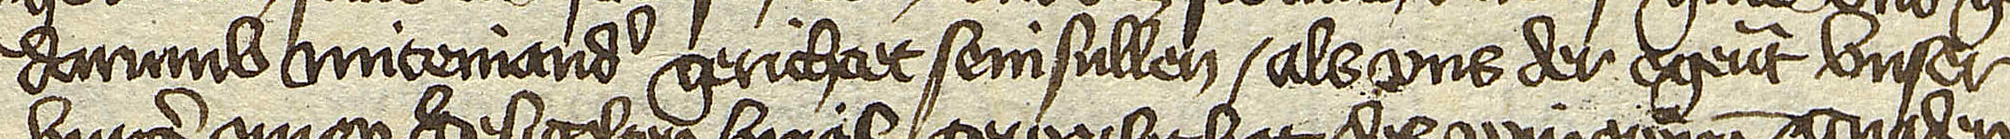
farumb miteinand* gerichtet ſein ſullen / als vns der egent* vnſer
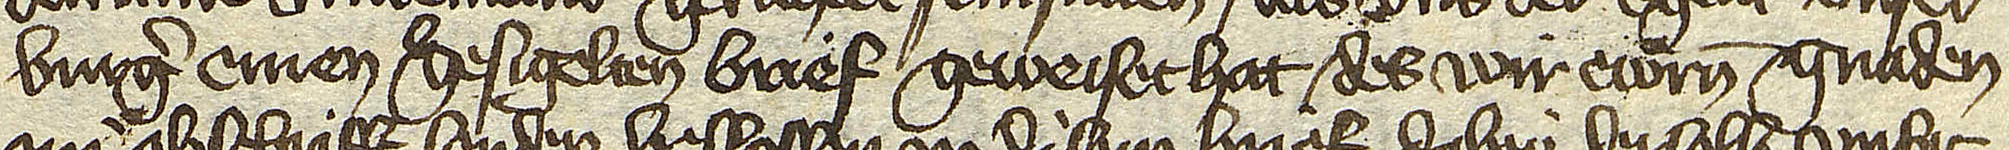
burg* einen geſigelten brief geweiſet hat / des wir ewrn* gnaden
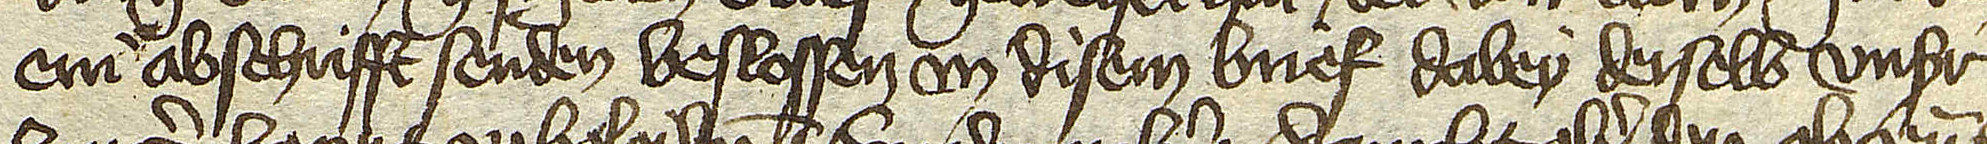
ein abſchrifft ſenden beſloſſen in diſem brief dabey derſelb vnſ*r
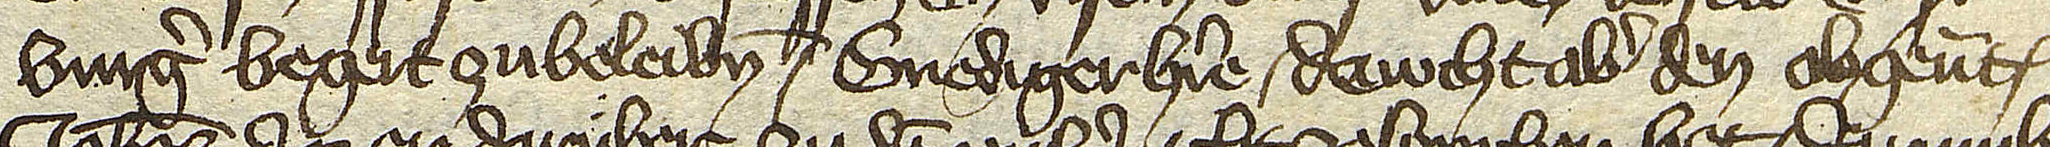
Burg* begert cʒubeleibn* / Gnediger hr*e / dewcht ab* den obgent*
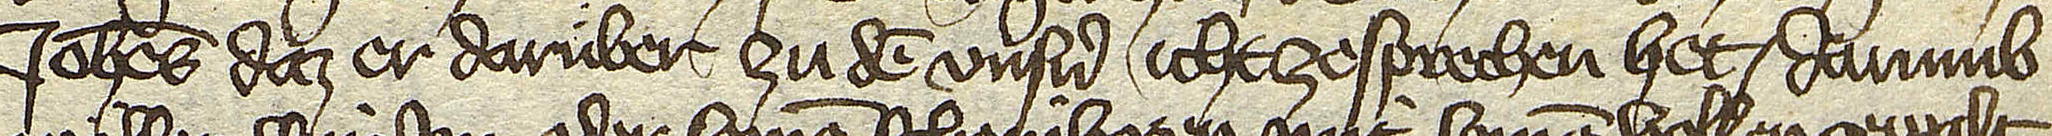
Iohes* daʒ er darüber cʒu de* vnſn* icht cʒeſprechen het / darumb
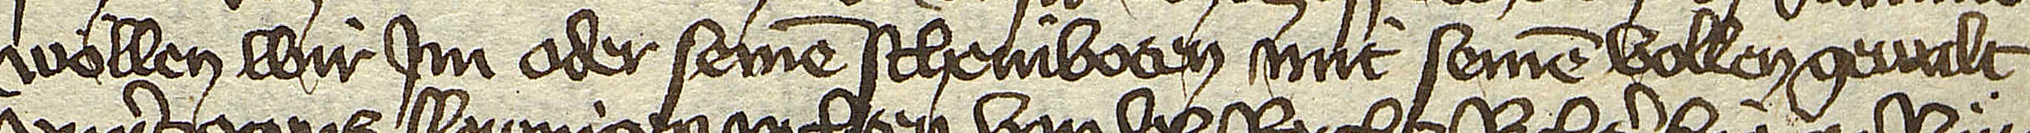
wöllen wir Im oder ſeine* ſcheinboten mit ſeine* vollen gewalt
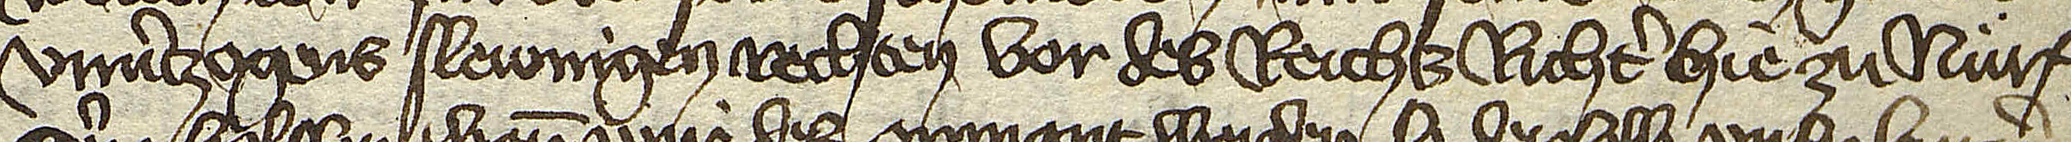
vnu*cʒogens ſlewnigen rechten vor des Reichs Richt* hie cʒu Nür*
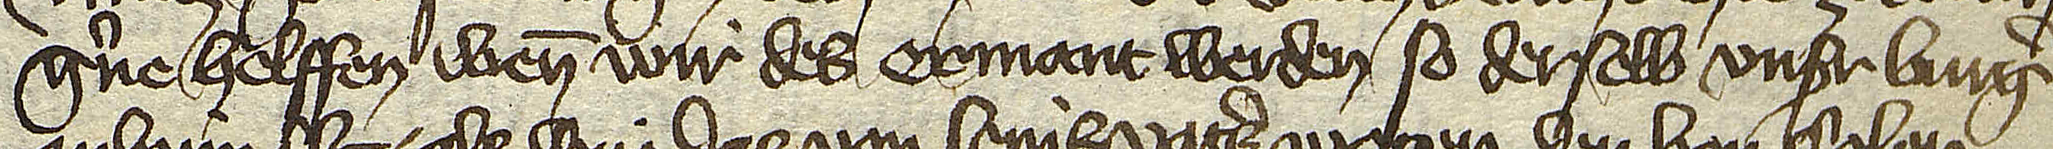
g*ne helffen wen* wir des ermant werden ſo derſelb vnſ*r burg*
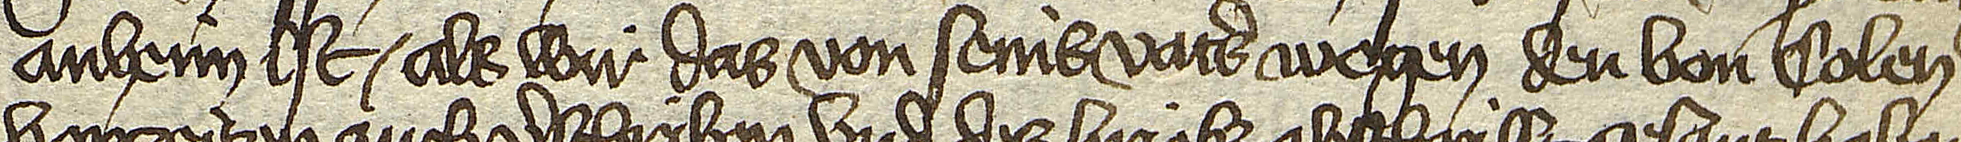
anheim iſt / als wir das von ſeins vats* wegen den von Colen
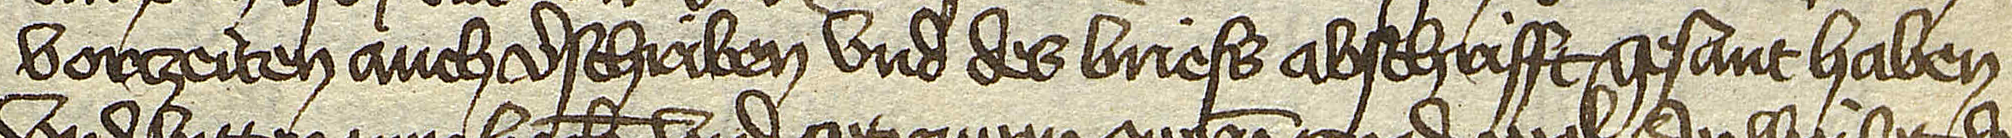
vorcʒeiten auch v*ſchriben vnd des briefs abſchrifft geſant haben
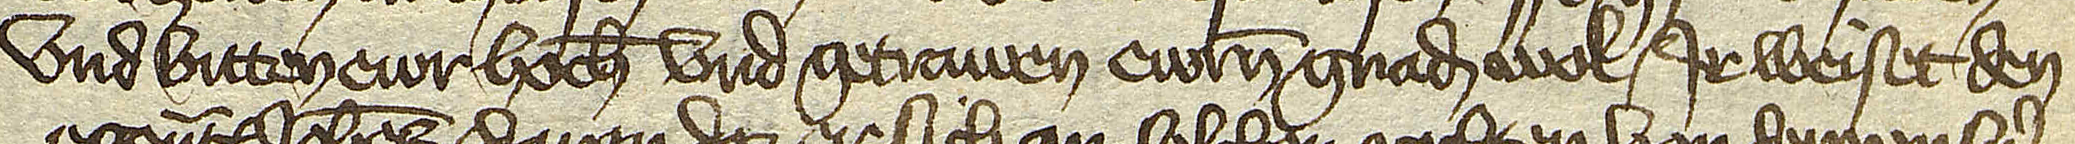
vnd bitten ewr hoch* vnd getrawen ewrn* gnad* wol / Ir weiſet den
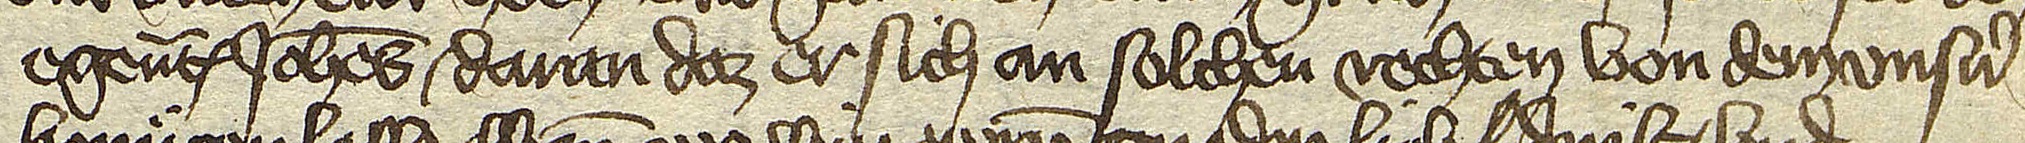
egent* Iohes* / daran daʒ er ſich an ſolchen rechten von dem vnſn*
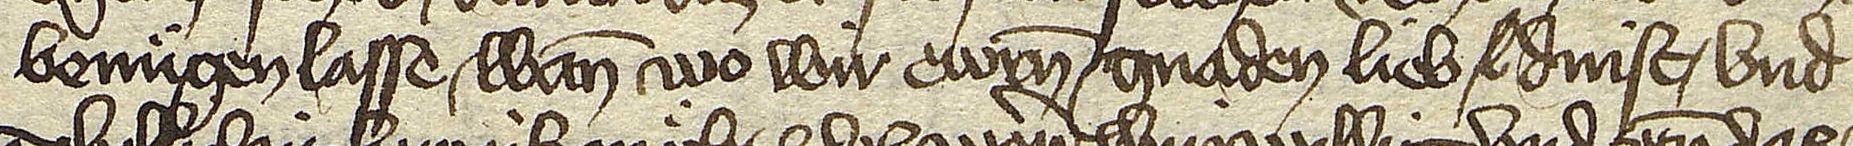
benügen laſſe / wan* wo wir ewrn* gnaden lieb l dinſt / vnd
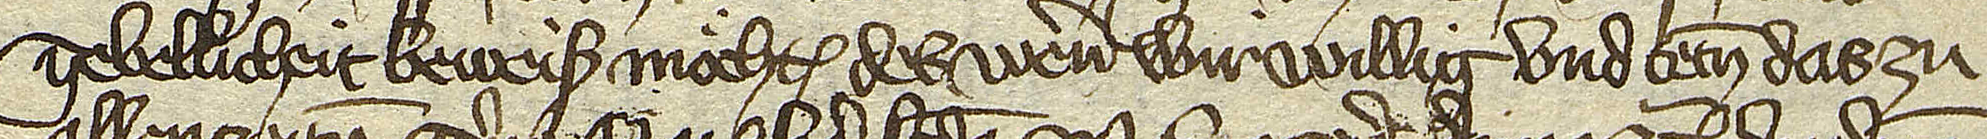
gevellicheit beweiſ* möcht* des wen* wir willig vnd tetn* das cʒu
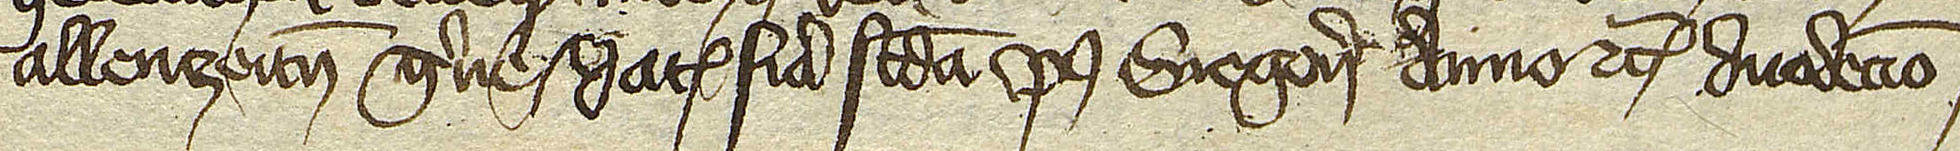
allencʒeitn* g*ne / dat* ſcda* p* Gregori* Anno ec* duodecio* /
